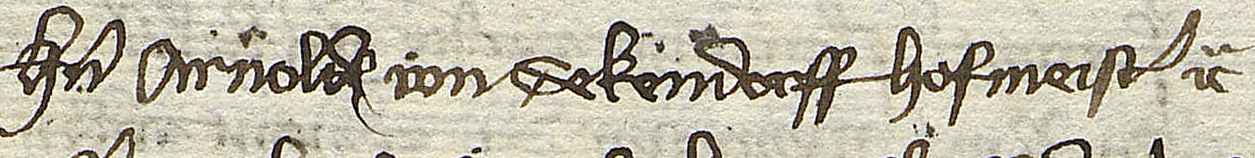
hn* Arnold von Sekendorff hofmeiſt* ec*
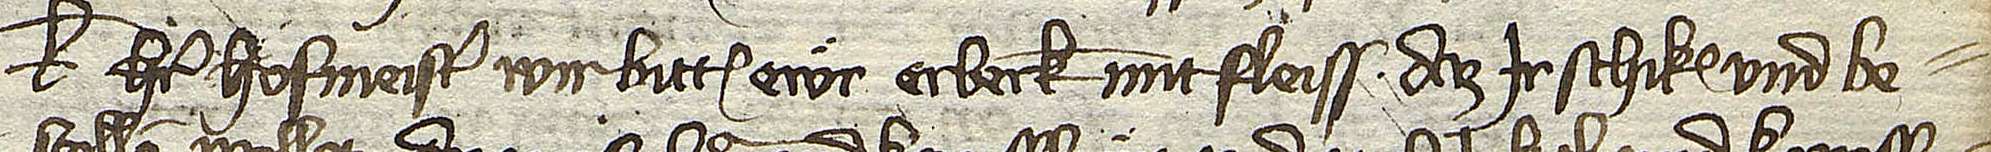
L* hr* hofmeiſt* wir bitt* eẅr erberk* mit fleiſſ . daʒ Ir ſchik* vnd be =
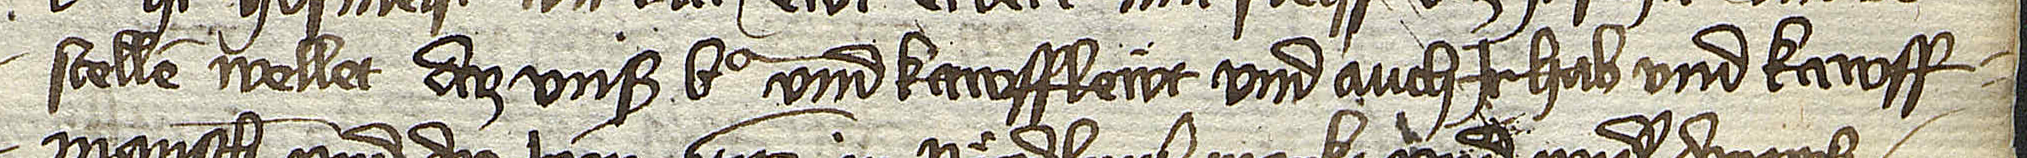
ſtelle* wellet daʒ vnſ* b* vnd kawffleẅt vnd auch Ir hab vnd kawff =
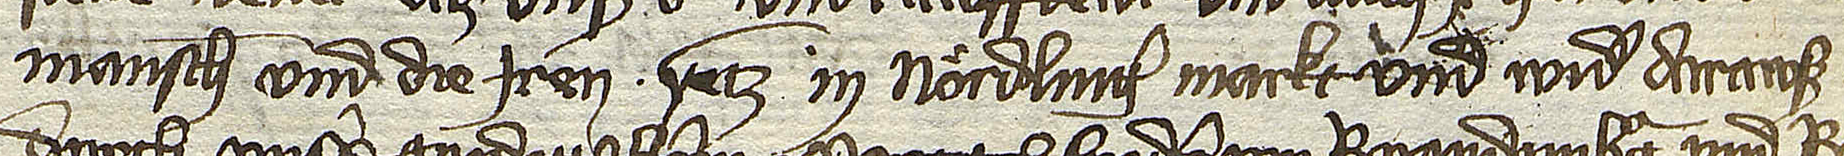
manſch* vnd die Iren yecʒ* in Nördling* markt vnd wid* darawſʒ
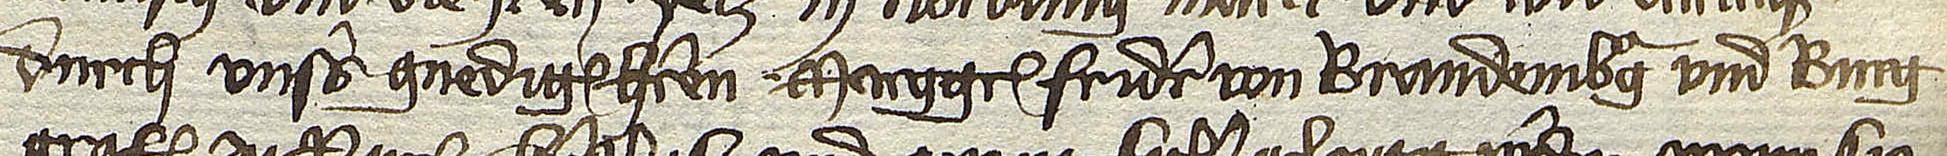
durch vnſs* gnedig* hr*en Marggr* fridr* von Brandemb*g vnd Burg
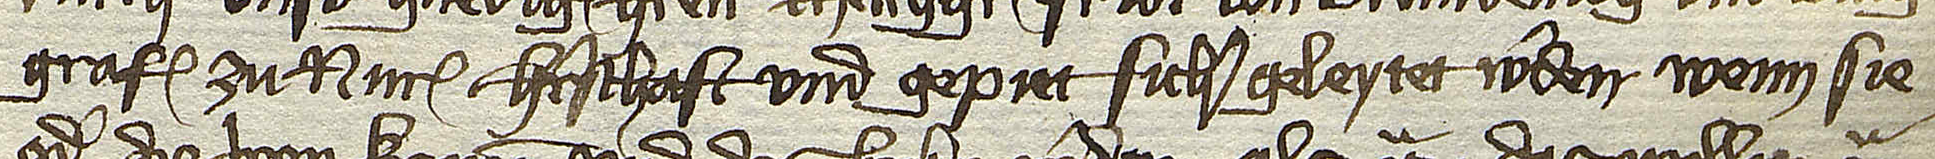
graf* ʒu Nur* / hr*ſchaft vnd gepiet ſich* geleytet w*den wenn ſie
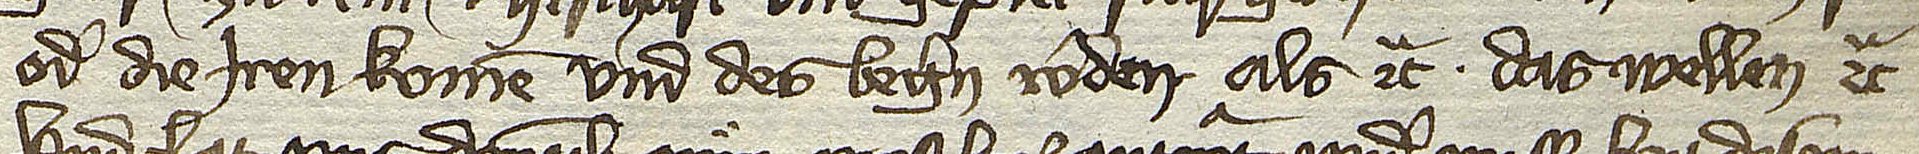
od* die Iren kome* vnd des beg*n w*den . als ec* . das wellen ec*
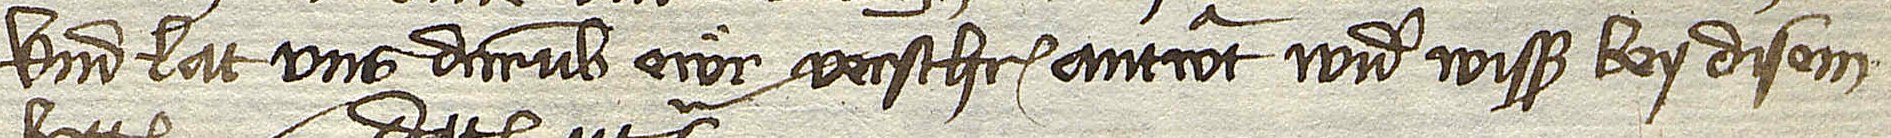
Vnd lat vns darub* eẅr verſchr* antwt* wid* wiſſ* bey diſem
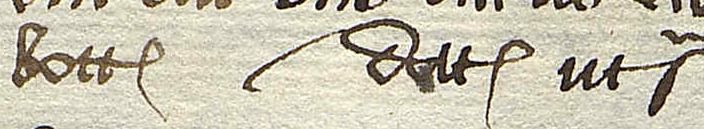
bott* / Dat* ut ſ*
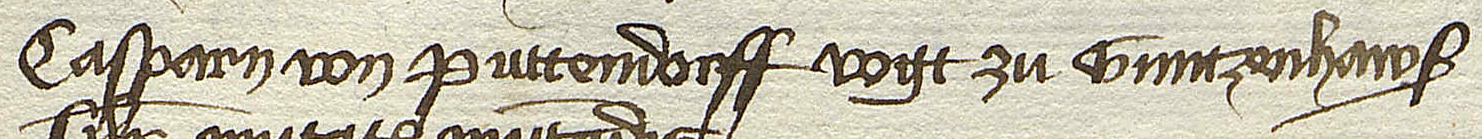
Caſparn von Puttendorff vogt ʒu Guncʒenhawſ*
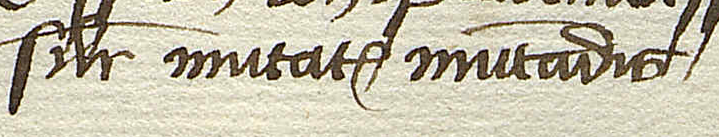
ſilr* mutat* mutadis* /
